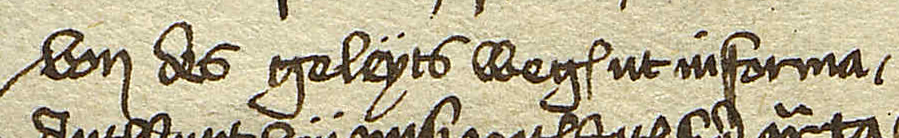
von des geleyts weg* ut in forma /
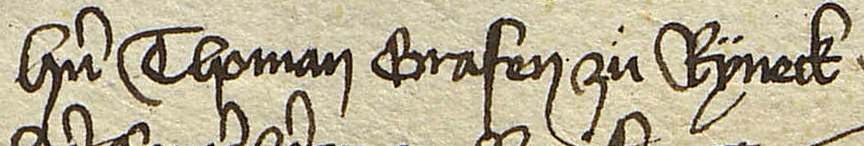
hn* Thoman Grafen cʒü Ryneck
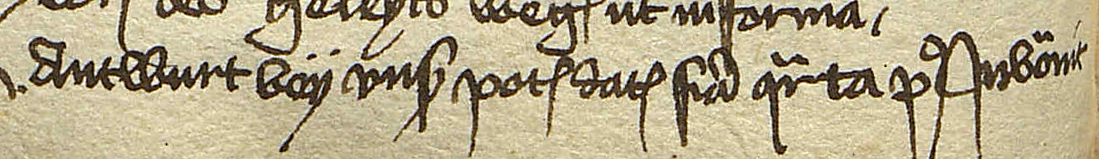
Antwurt bey vnſ* pot* dat* fia* qrta* p* Invo*uit
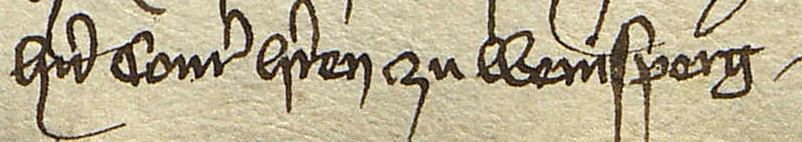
hn* Conr* h*ren cʒu weinſperg
